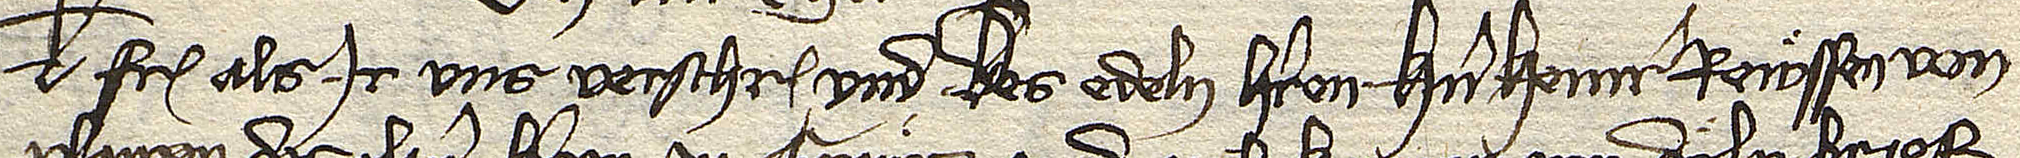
L* fr* als Ir vns verſchr* vnd Des edeln h*ren . Hn* Heinr* Reẅſſen von
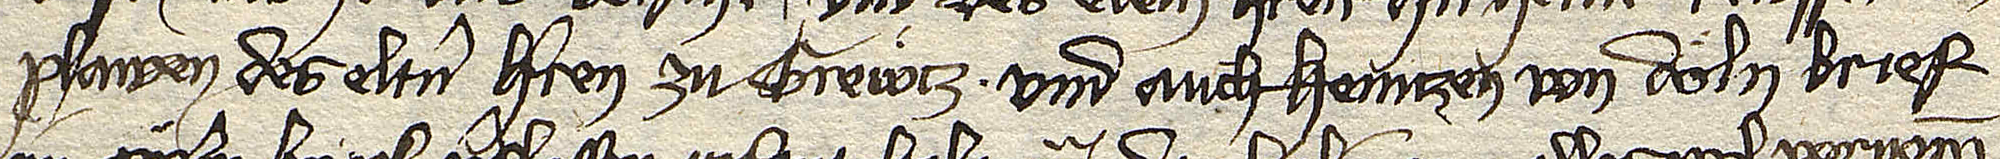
plawen des eltn* h*ren ʒu Greẅcʒ . vnd auch heintʒen von döln brief
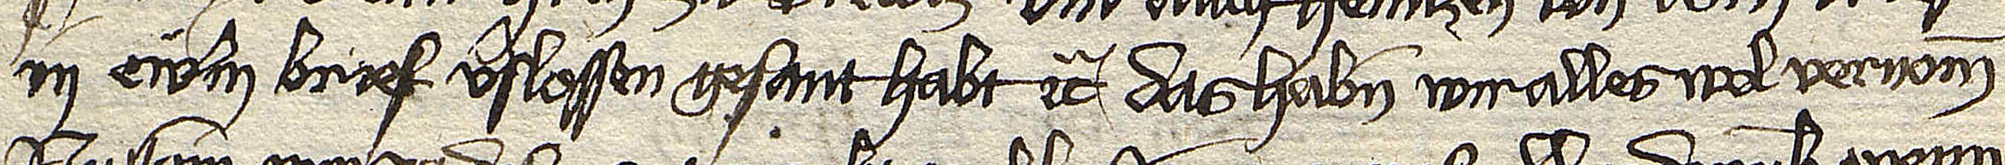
in eẅ*m brief v*ſloſſen geſant habt ec* das habn* wir alles wol vernom*
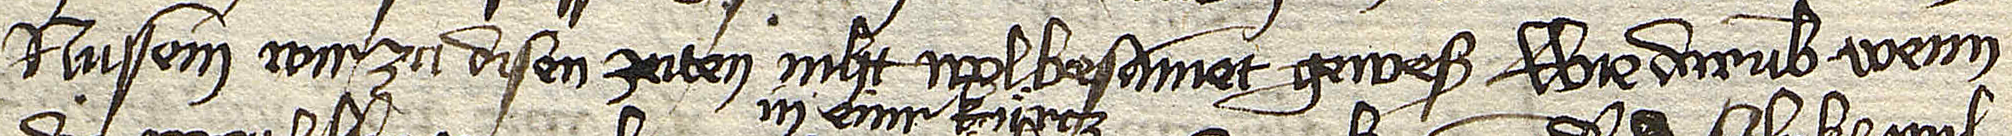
Nu ſein wir ʒu diſen ʒeiten niht wol beſam*et geweſ* / Wie darub* wenn
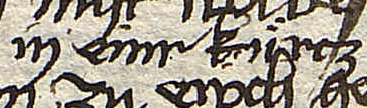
in einr kürcʒ
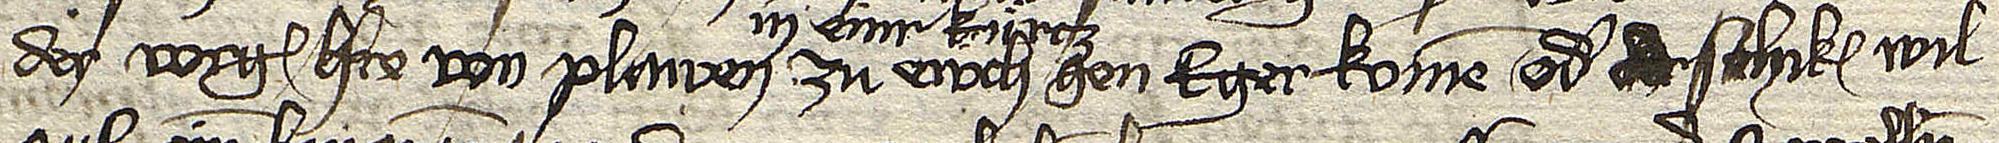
der vorg* h*re von plawen ʒu ewch gen Eger kome* / od* der ſchik* wil
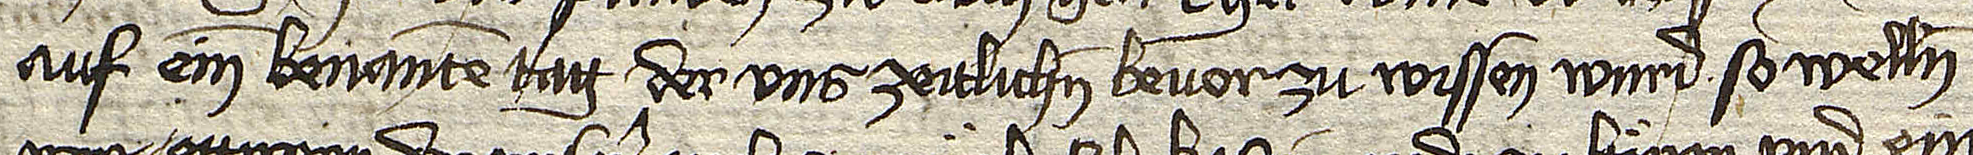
auf ein* benante* tag / der vns ʒeitlichn* beuor ʒu wiſſen wurd . ſo welln*
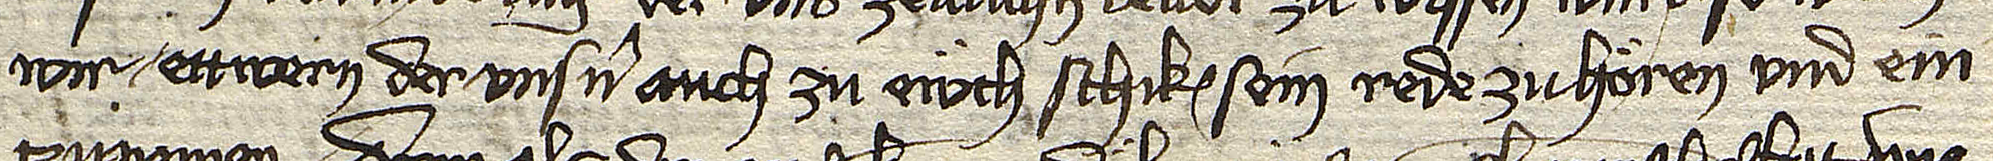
wir / ettwern der vnſn* auch ʒu eẅch ſchik* ſein rede ʒu hören vnd ein
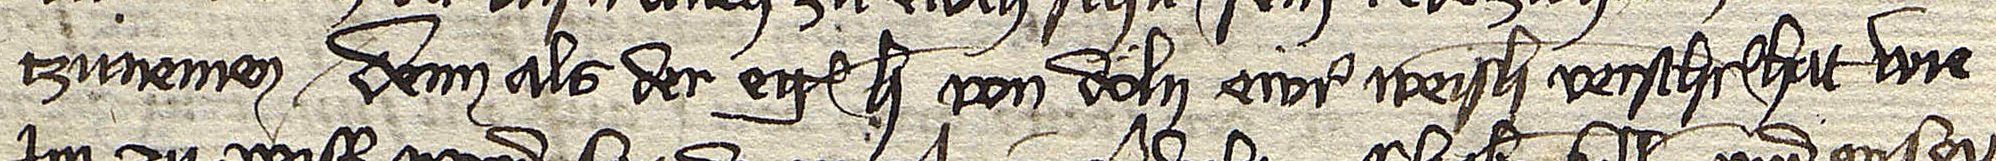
cʒunemen / Denn als der eg* h* von döln eẅr* weiſh* verſchr* hat wie
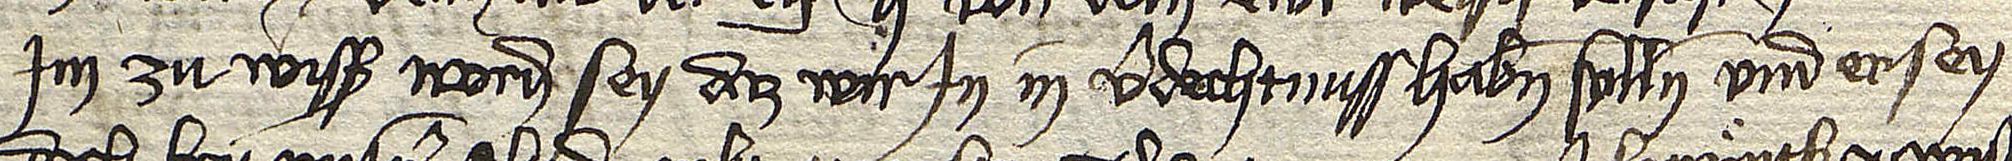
Im ʒu wiſſ* word* ſey daʒ wir In in v*dechtnuſſ habn* ſolln* vnd er ſey
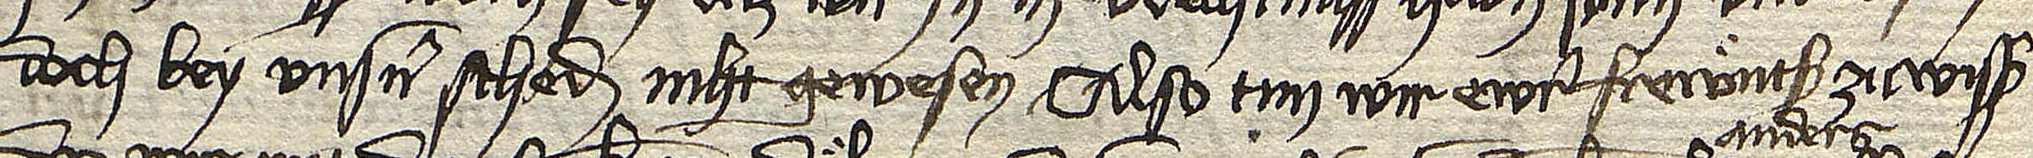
doch bey vnſn* ſched* niht geweſen / Alſo tun wir ewr* freẅntſ* ʒu wiſſ*
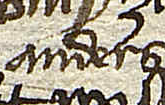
anders
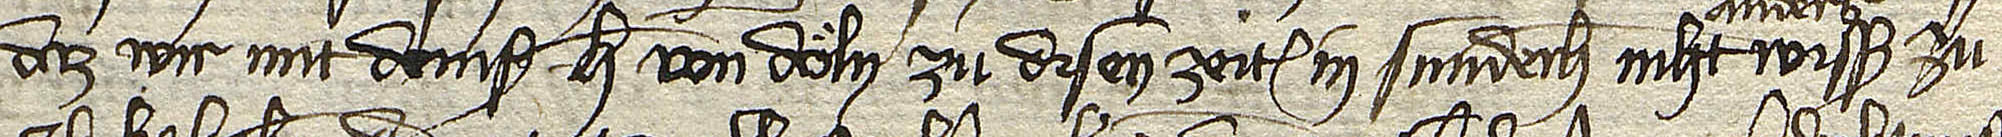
daʒ wir mit demſ* / h* von döln ʒu diſen ʒeit* in ſunderh* niht wiſſ* ʒu
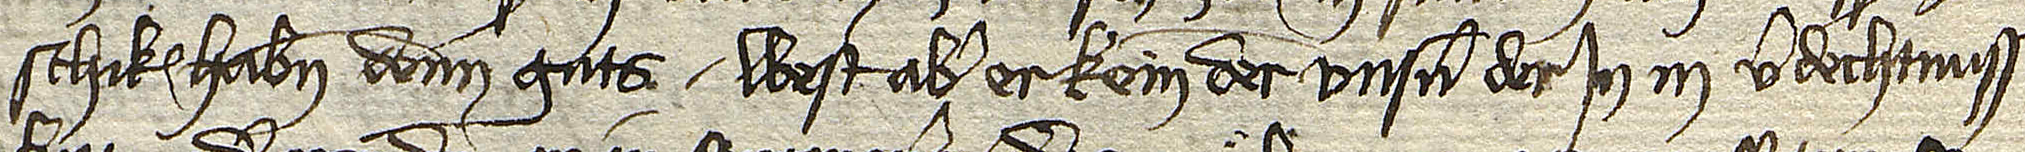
ſchik* habn* denn guts / Weſt ab* er kein* der vnſn* der In in v*dechtnuſſ
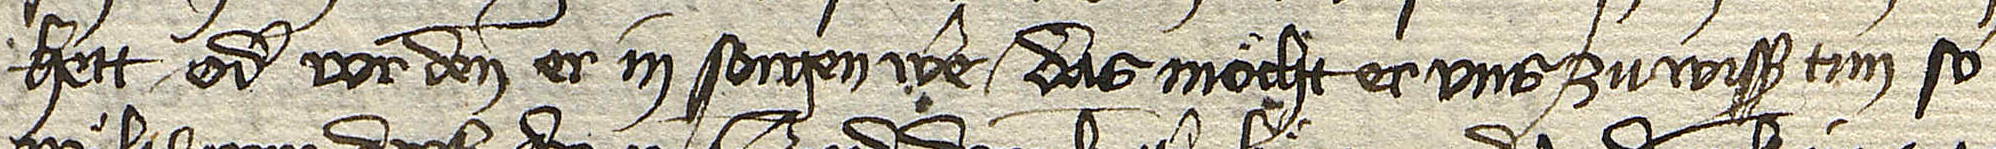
hett / od* vor den er in ſorgen w*e / Das möcht er vns ʒu wiſſ* tun ſo
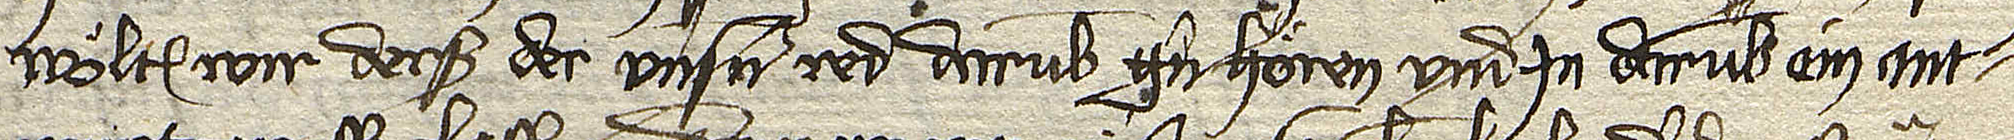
wölt* wir derſ* der vnſn* red darub* g*n hören vnd In darub* ein ant =
